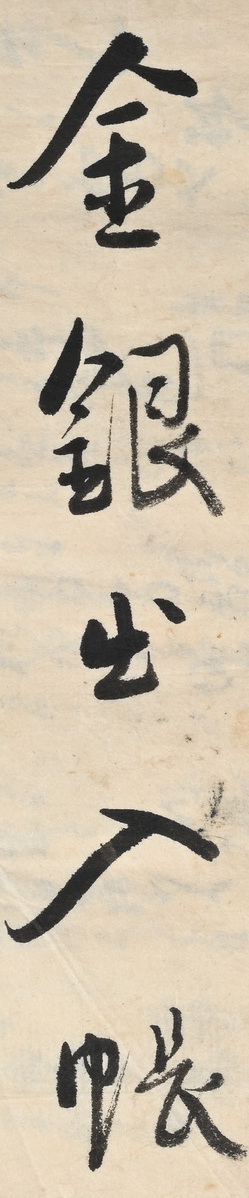金銀出入帳
